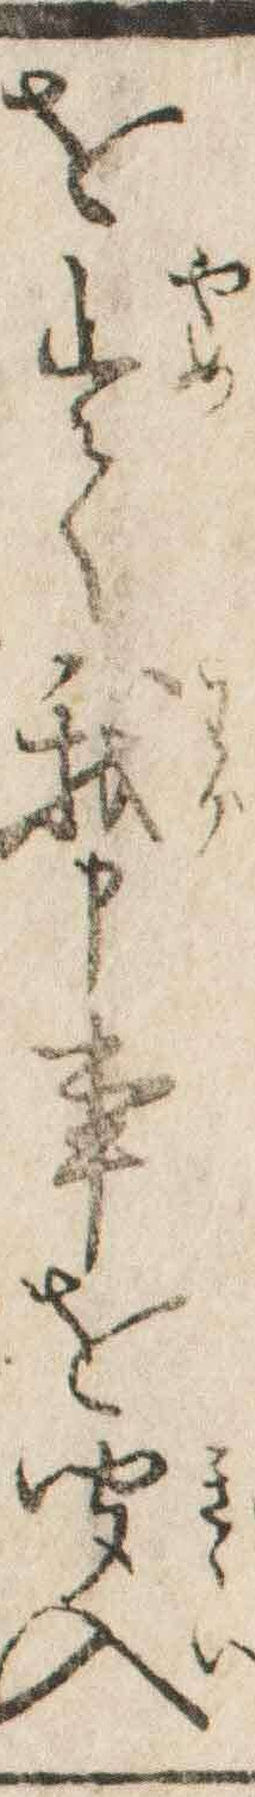を止て我申事を聞入
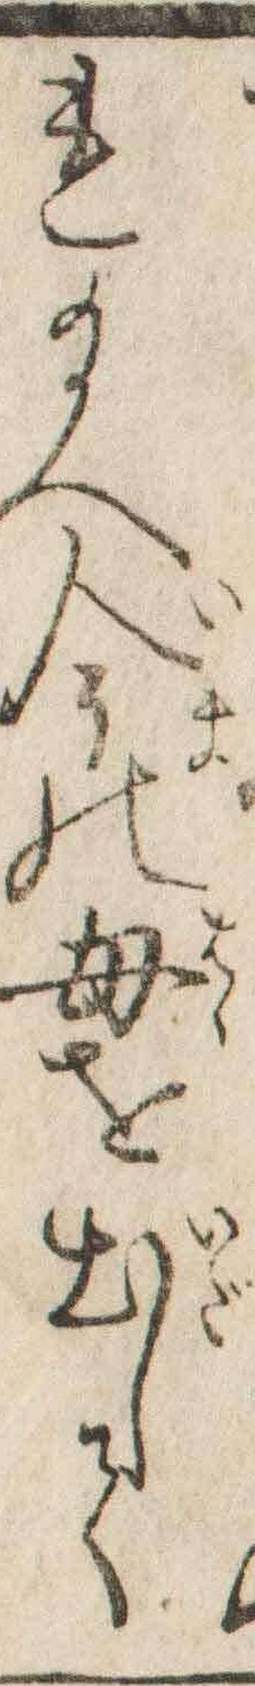れ給へ今の母を出して
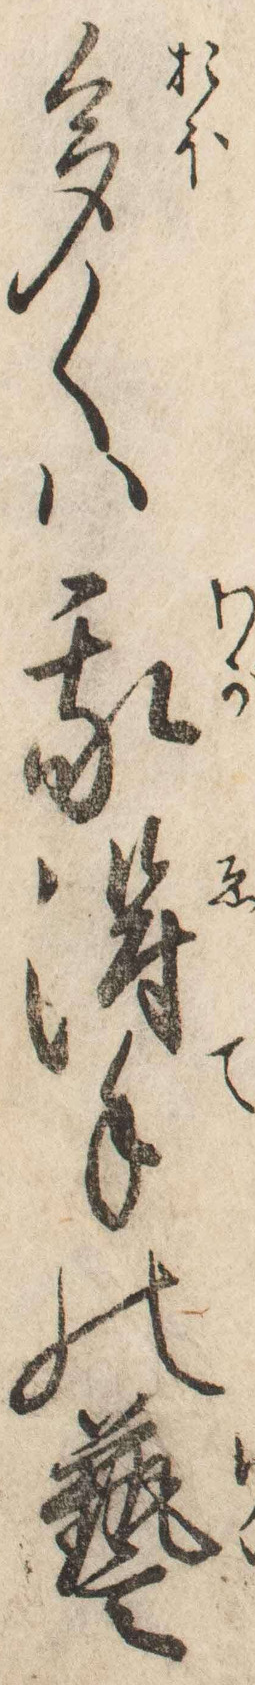多くは我得手の芸
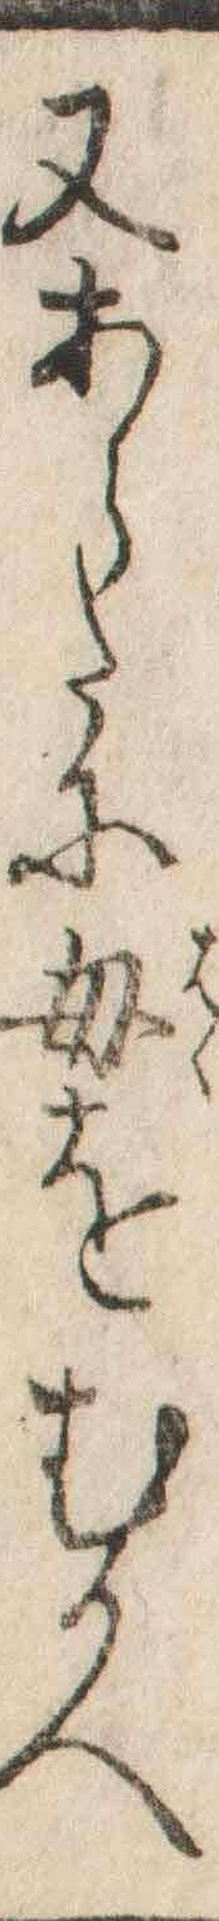又あらたに母をむかへ

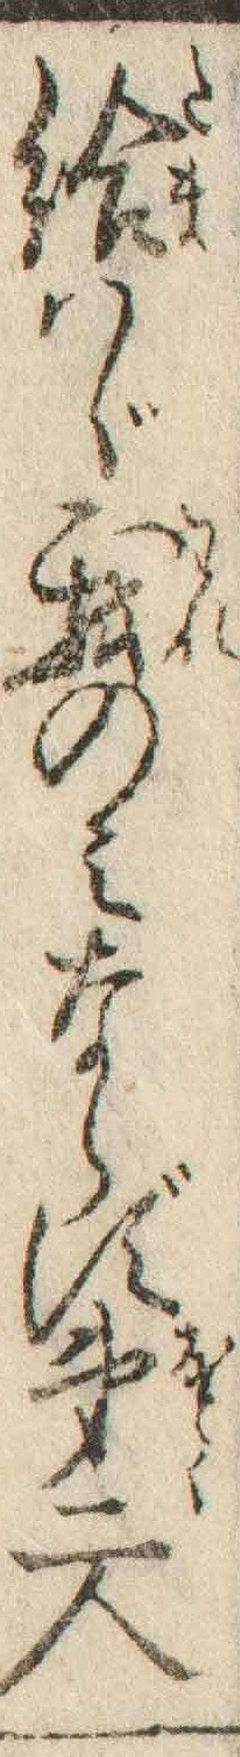給はゞ我のみならず弟二人
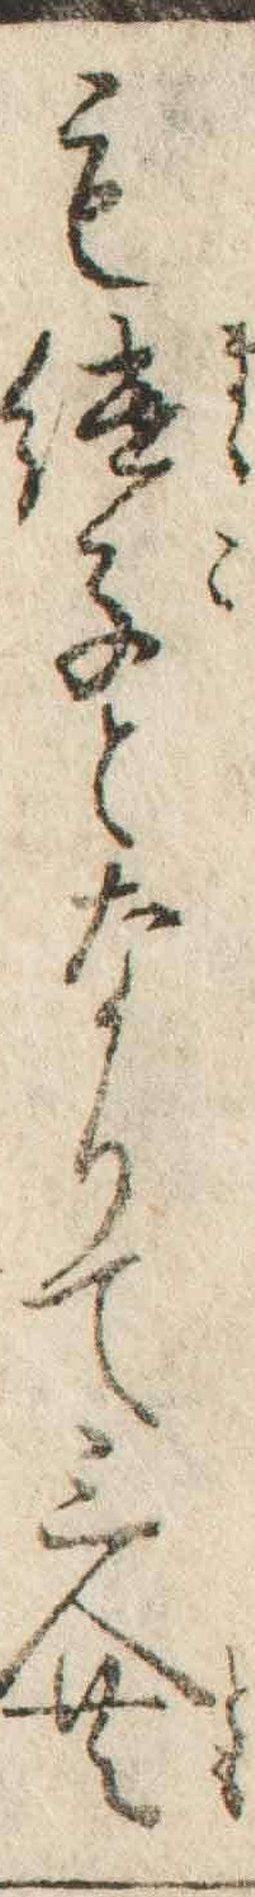も継子となりて三人共
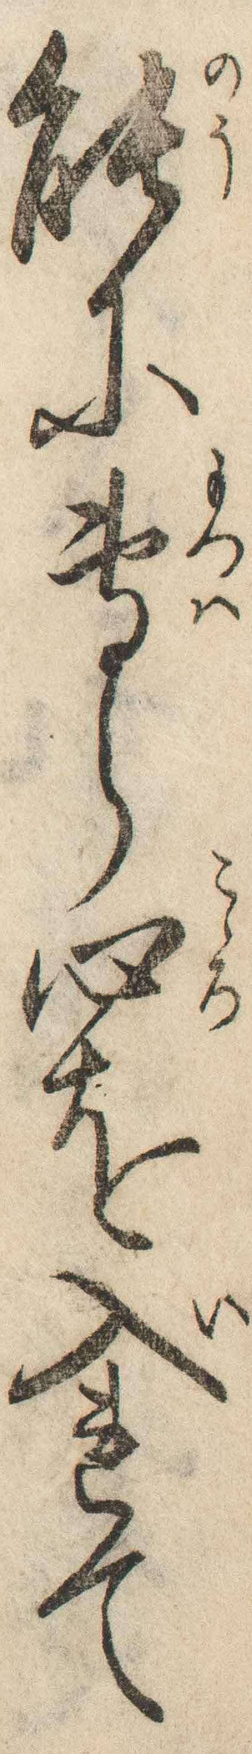能に専ら心を入れて
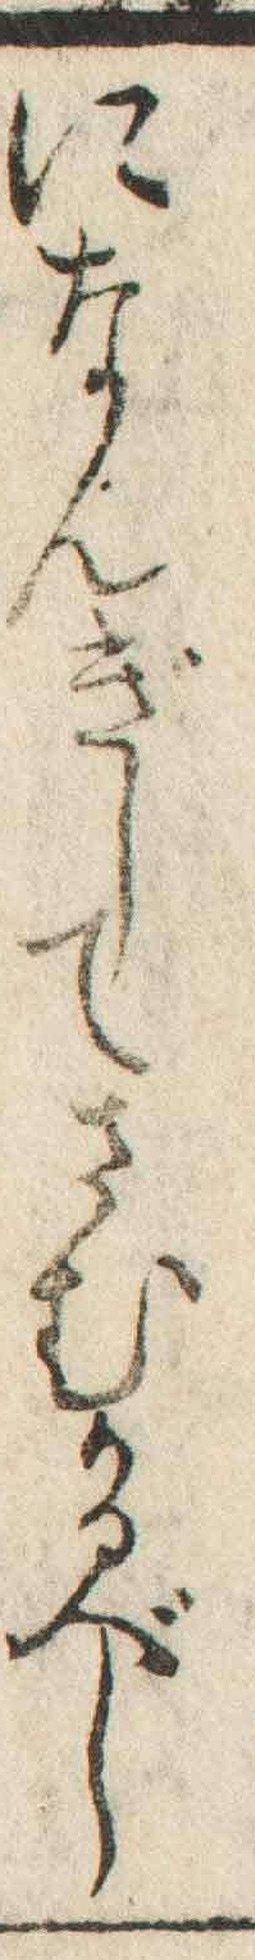になんぎしてさむかるべし
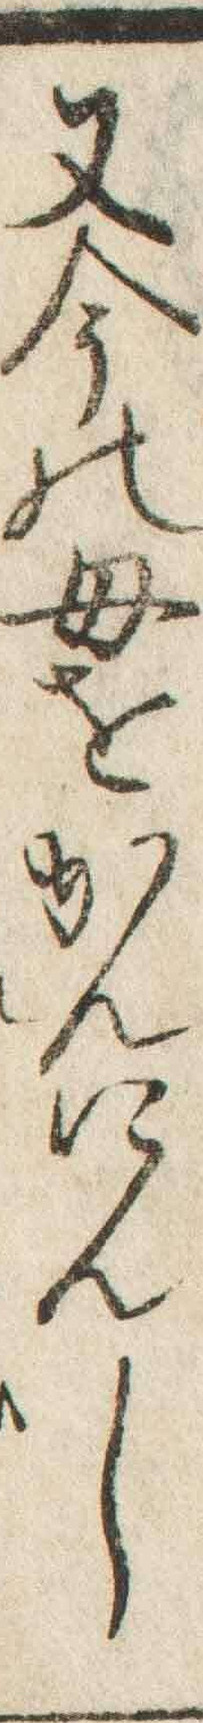又今の母をかんにんし
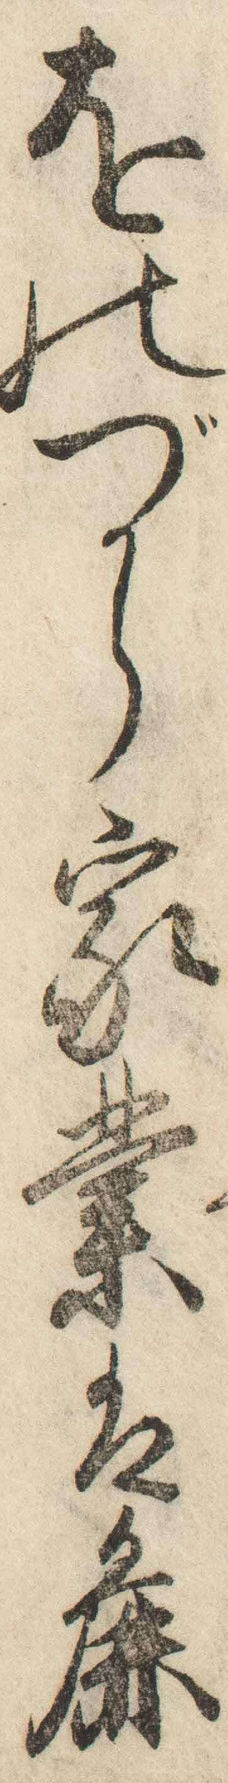をのづから家業は麁
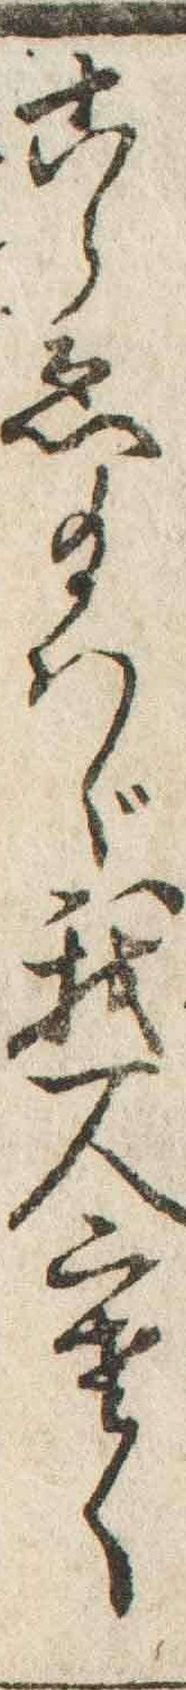こらゑ給はゞ我一人寒く
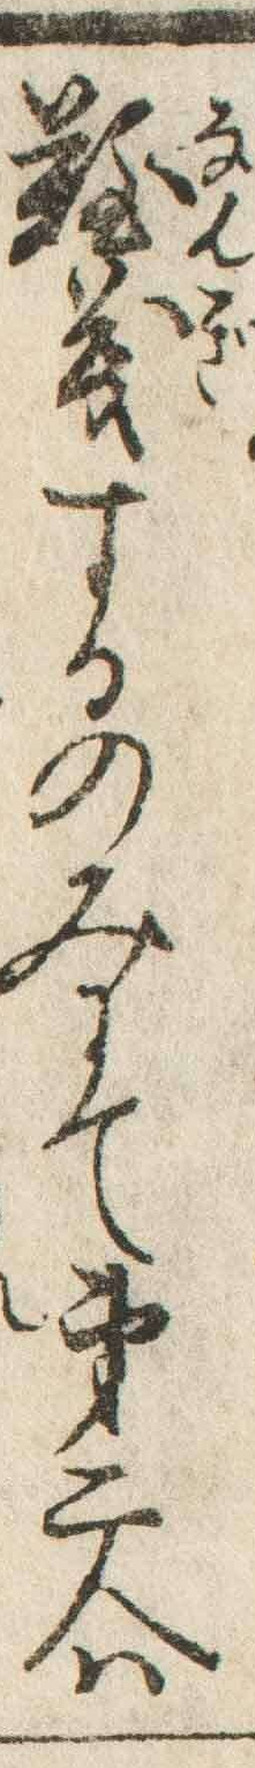難義するのみにて弟二人は
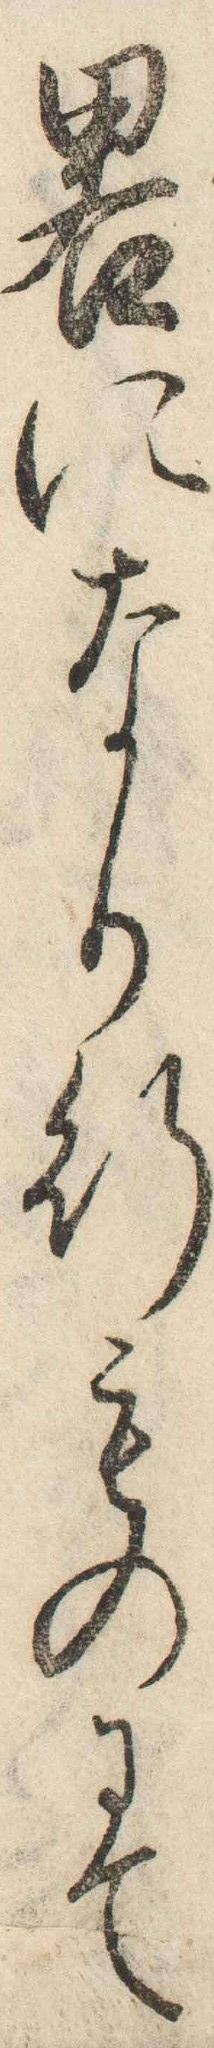略になり行ものにて
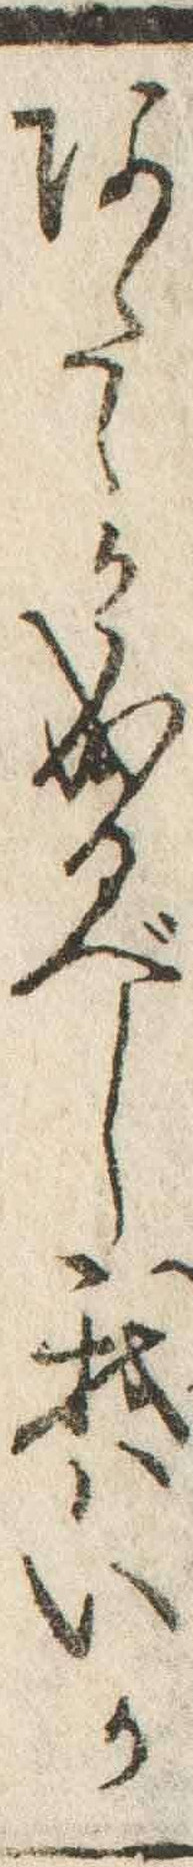あたゝか成べし我はいか
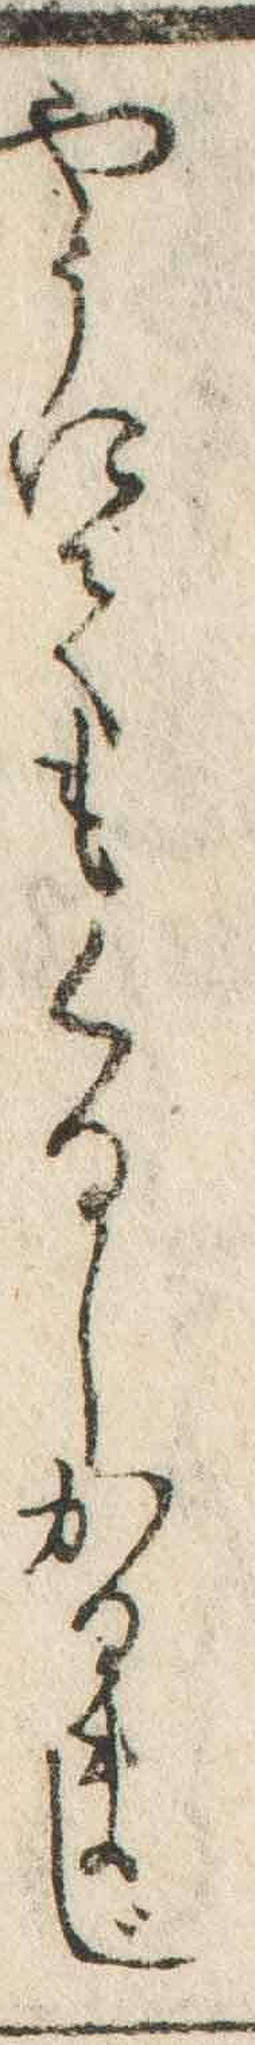やうにてもくるしかるまじ
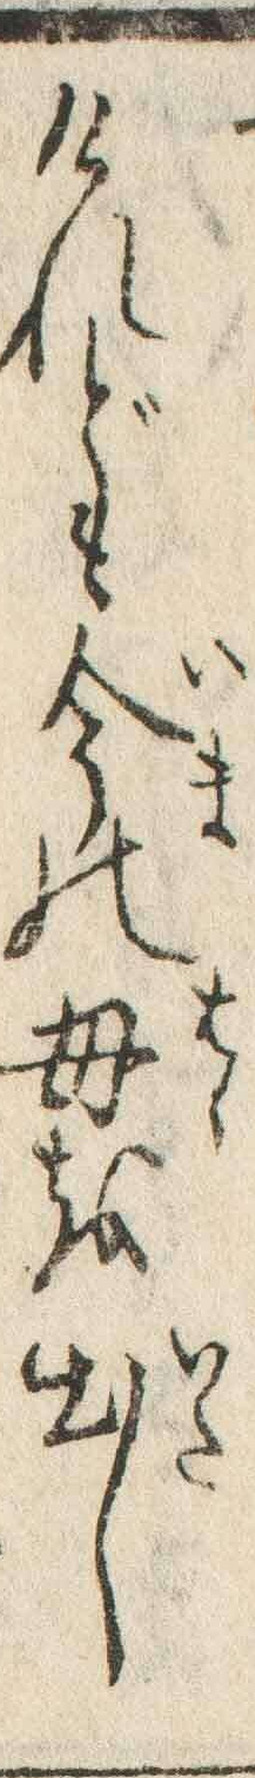けれども今の母を出し
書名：撫育草
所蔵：東京学芸大学附属図書館 国文学研究資料館
